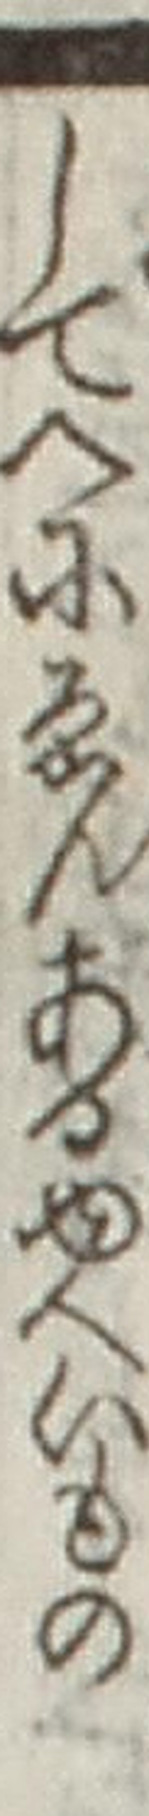してへにゑんあるゆへいもの
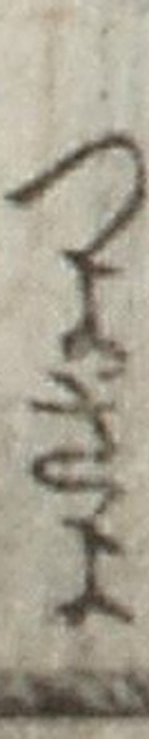つよさよ
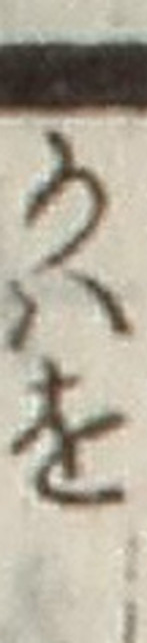かはを
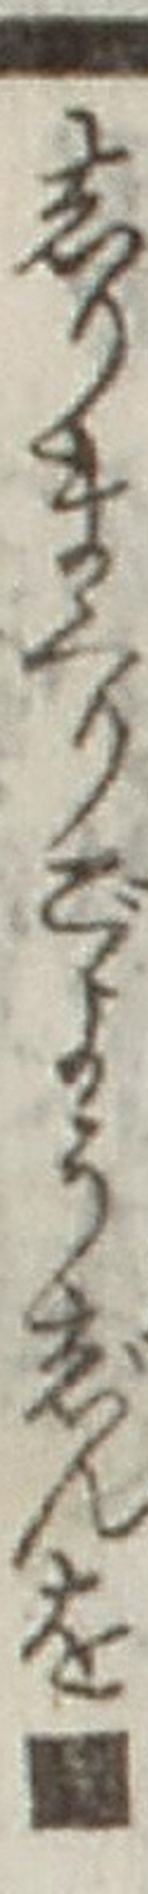しりまくりごようじんを

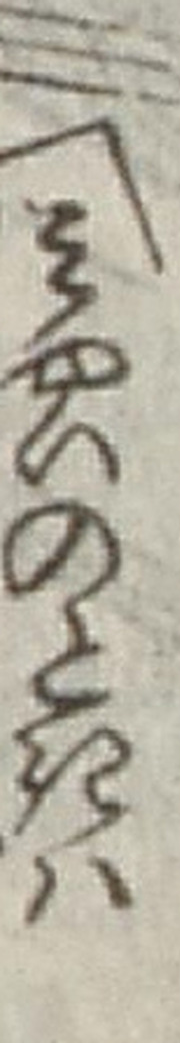〽みやいのときは
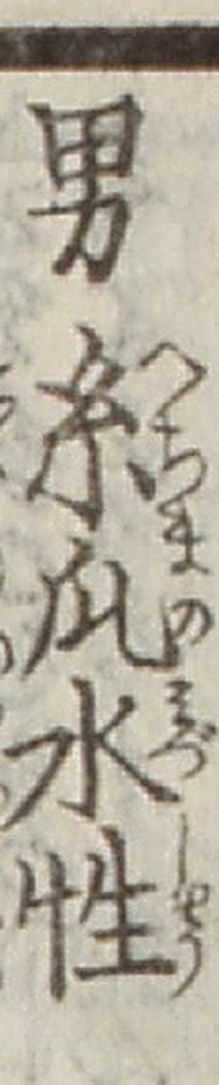男糸瓜水性
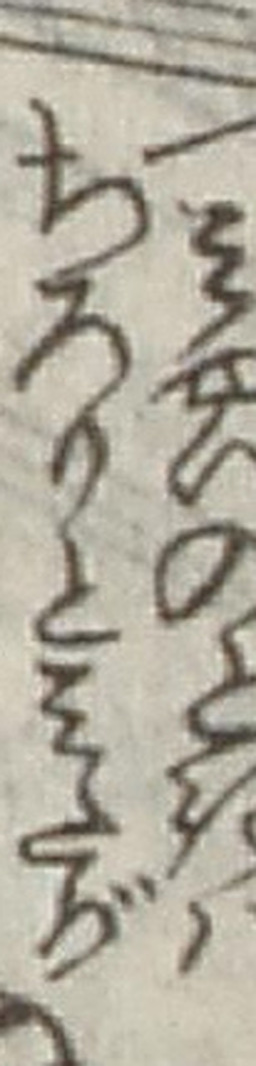ちろりとみたが
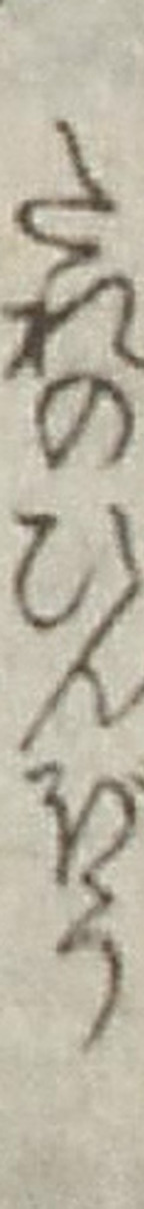たれのびんばう
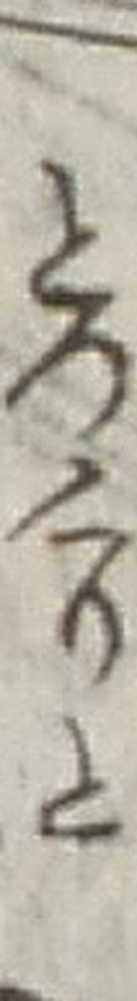とつくりと
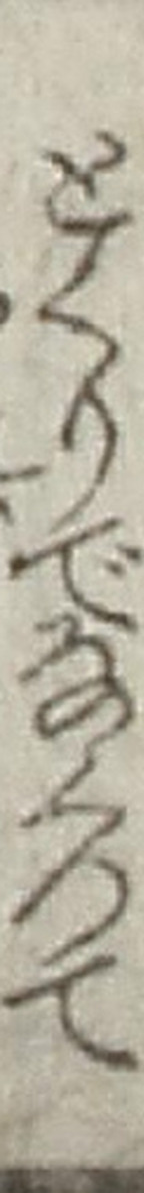とくりでなくつて
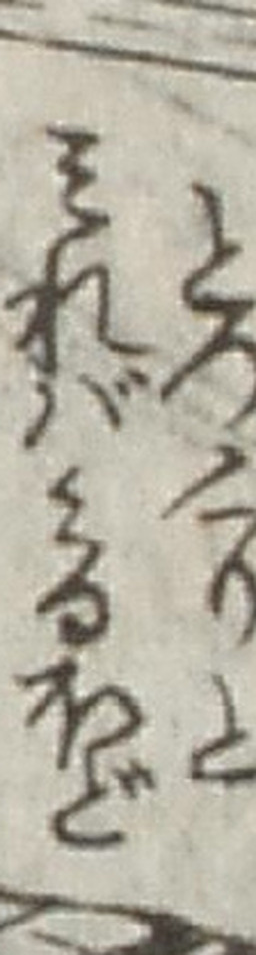みればみるほど
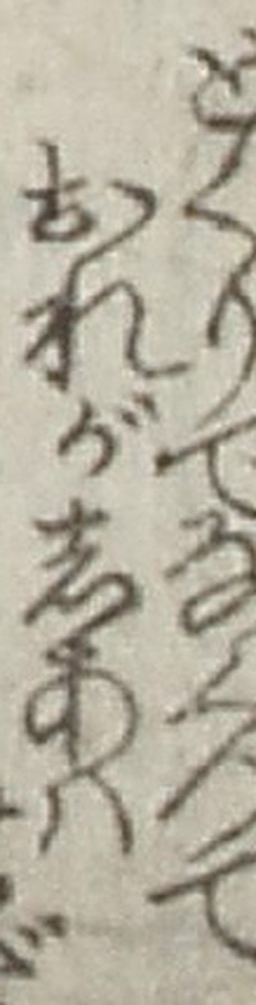おれがしあは
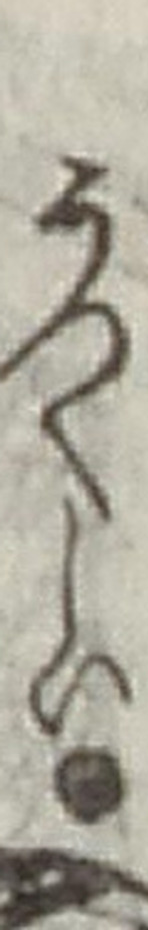うつくしい●
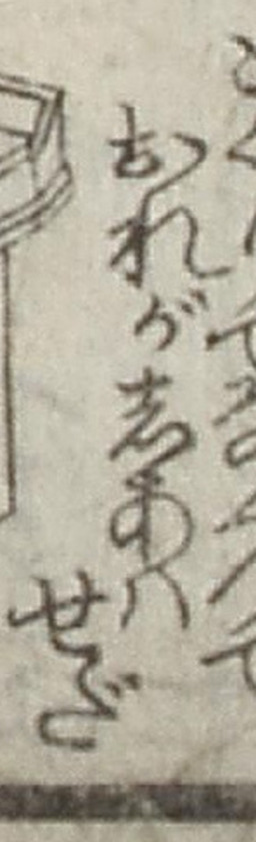おれがしあは
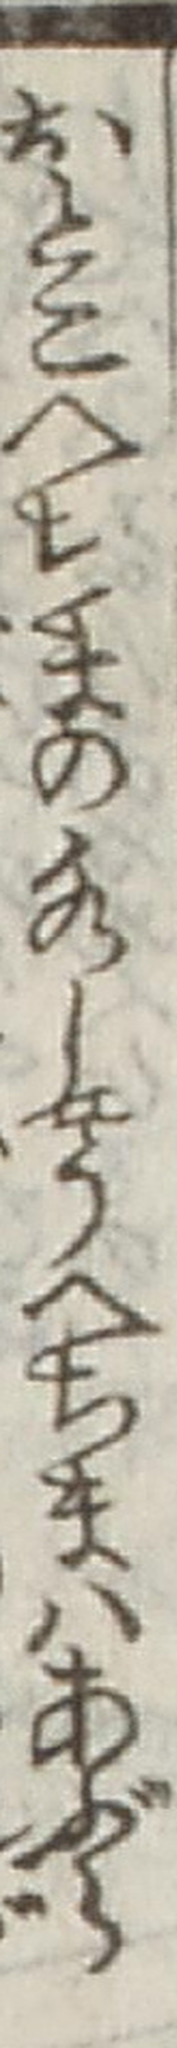おとこへちまの水しやうへちまはあぶら
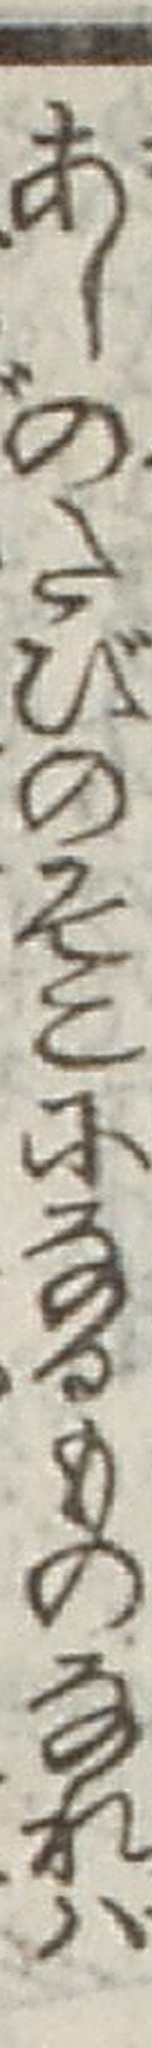あしのたびのそこになるものなれば
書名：三世相出雲當座帳　上下冊
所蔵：東京大学地震研究所図書室 Earthquake Research Institute Library, The University of Tokyo, JAPAN
